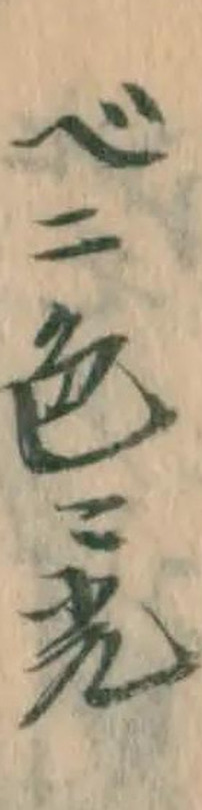ベニ色ニ光
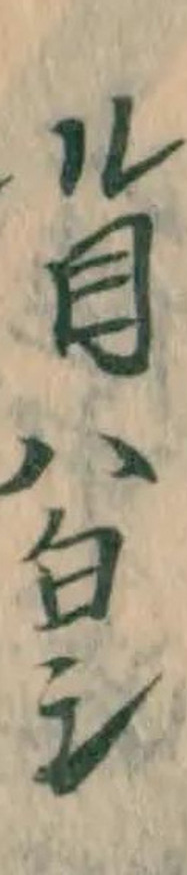ル目ハ白シ
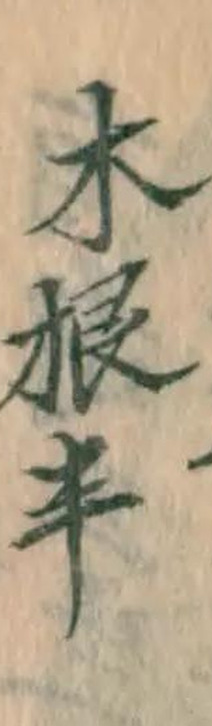木根半
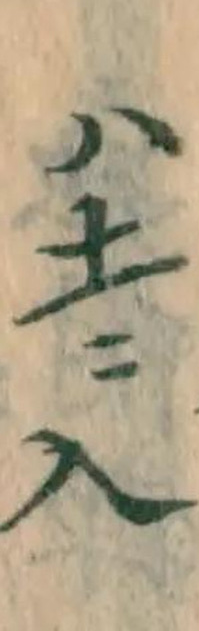ハ土ニ入
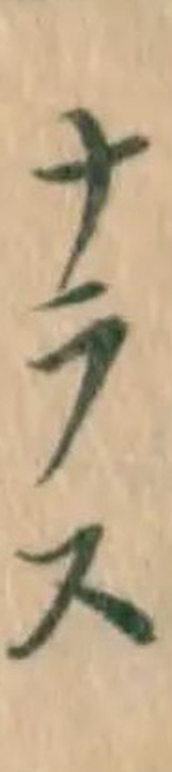ナラス

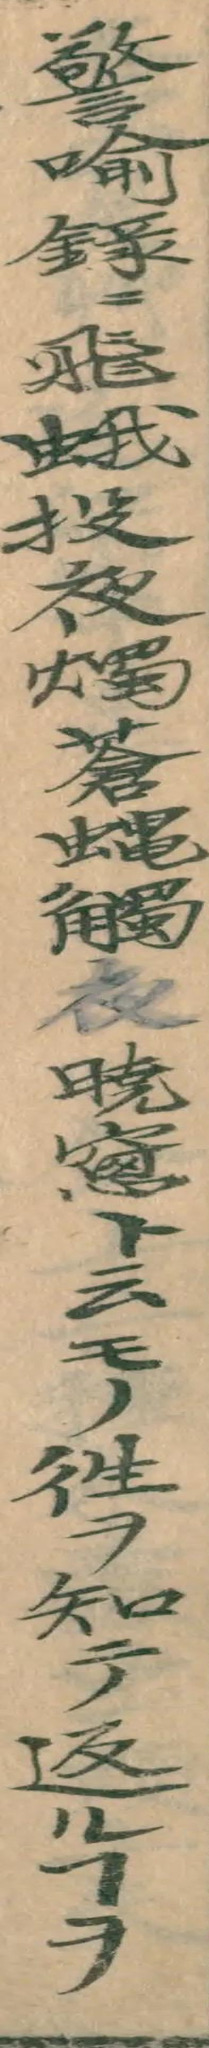警喩録ニ飛蛾投夜燭蒼蝿觸夜暁窻ト云モノ往ヲ知テ返ルコトヲ
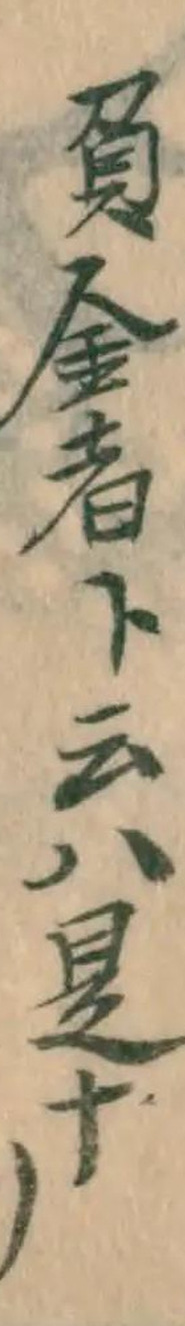負金者ト云ハ是ナリ
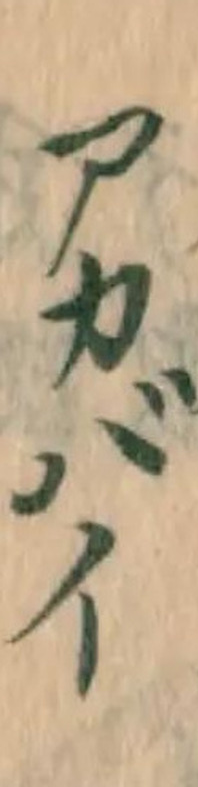アカバイ
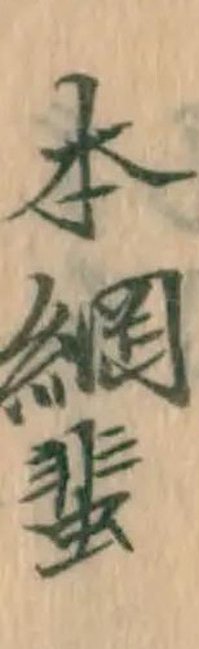本綱蜚
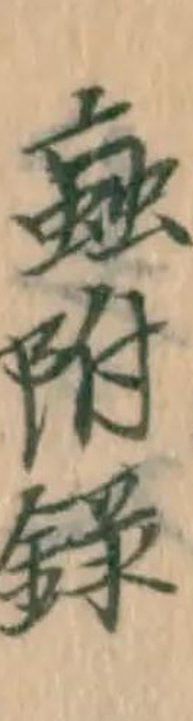蝱附録
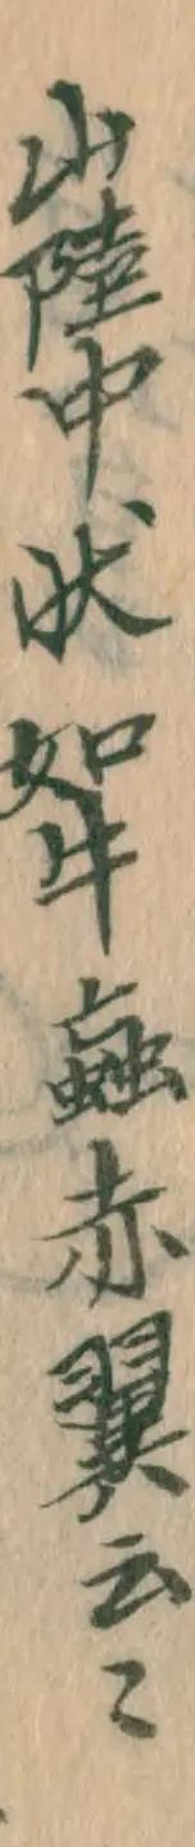山陸中状如牛蝱赤翼云々
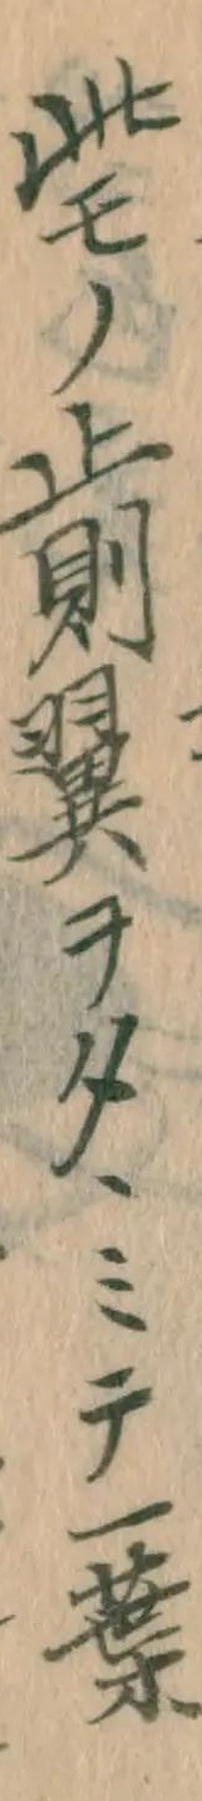此モノ止則翼ヲタヽミテ一葉
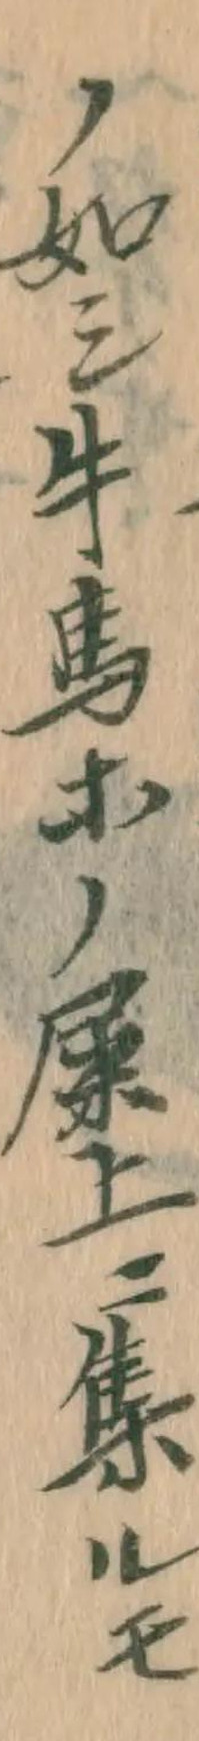ノ如シ牛馬等ノ屎上ニ集ルモ
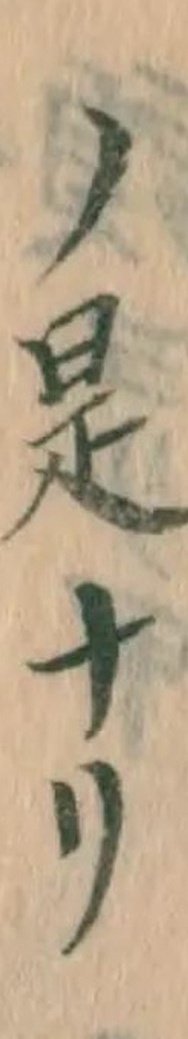ノ是ナリ
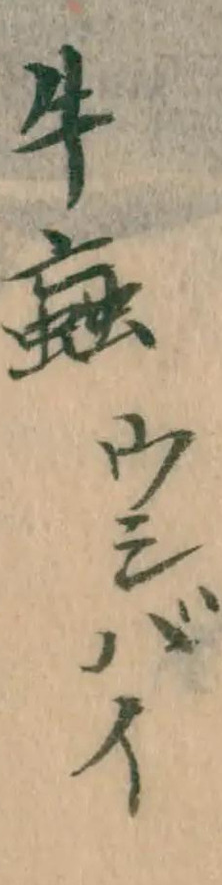牛蝱ウシバイ
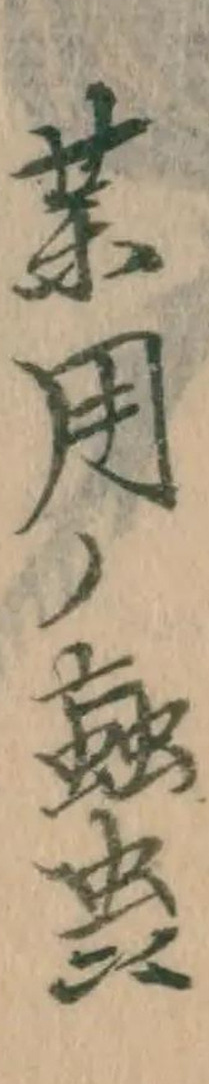薬用ノ蝱蟲
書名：千蟲譜 3巻. [2]
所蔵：国立国会図書館 National Diet Library, JAPAN
